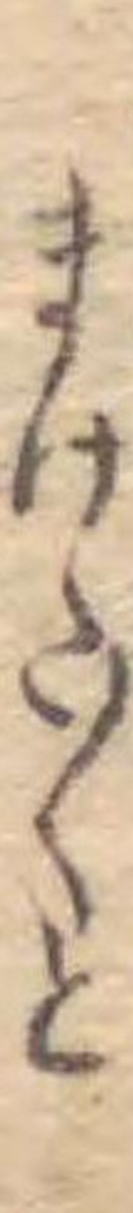まけた〳〵と
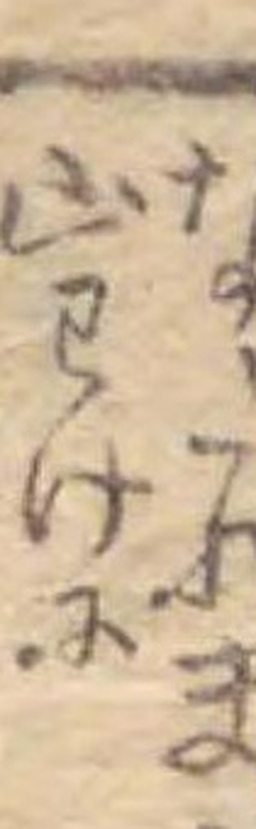山わけに
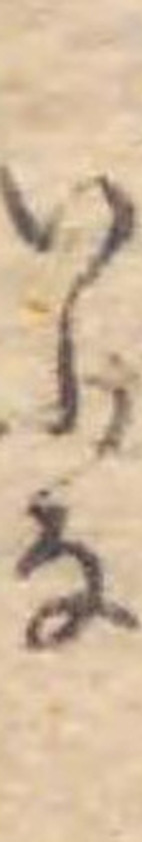いふな
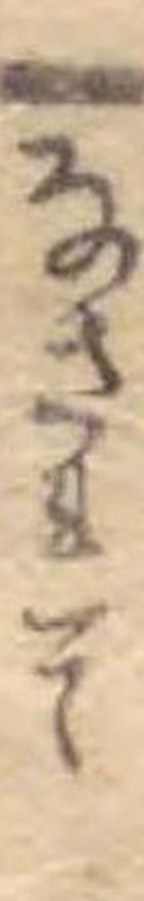なされて
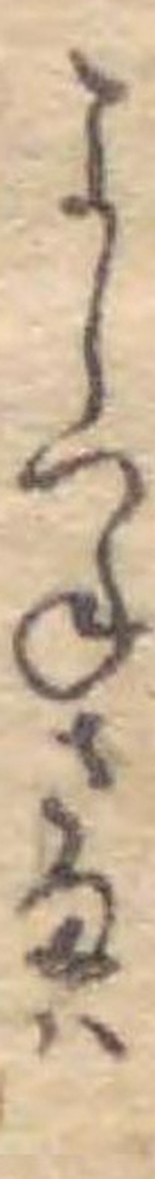よしつねさまは
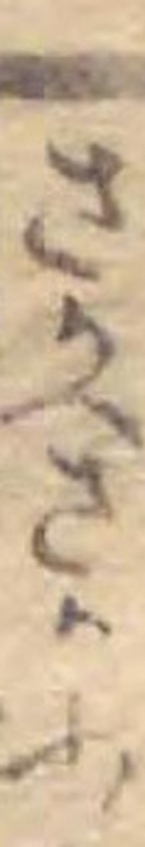さかへさかふる
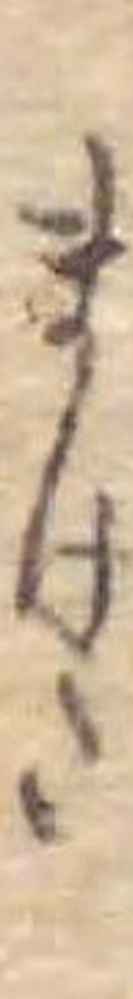まけた
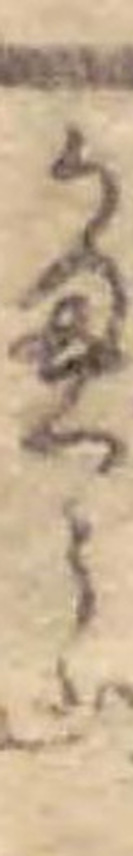かまくら山
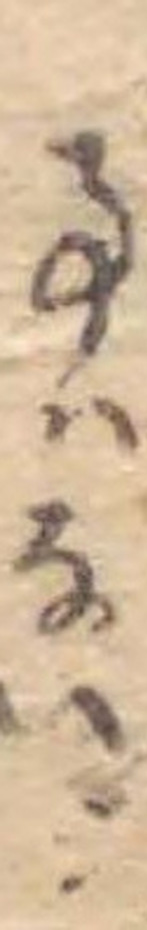事はない
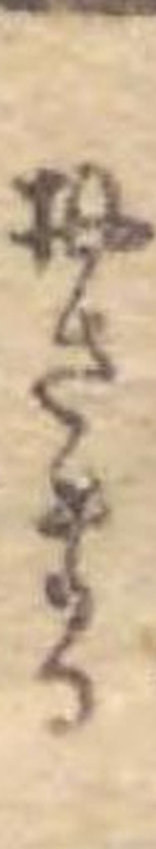おさまる
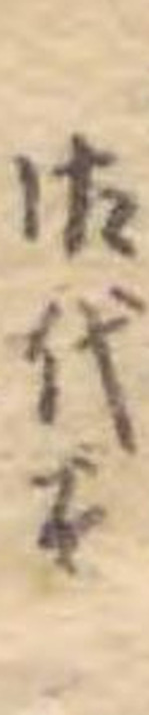御代ぞ
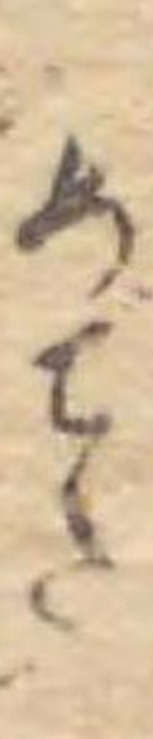めでた
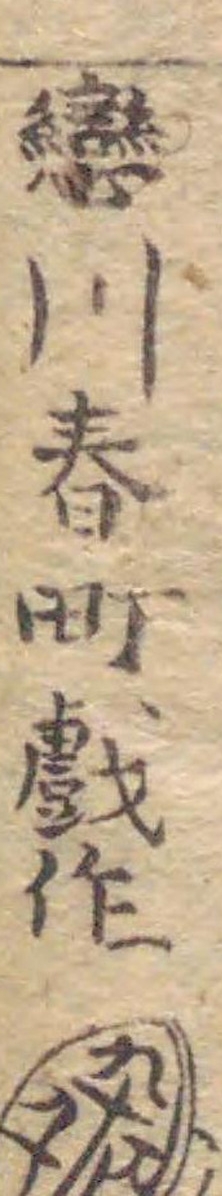恋川春町戯作
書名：悦贔負蝦夷押領 : 3巻
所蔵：国立国会図書館 National Diet Library, JAPAN
